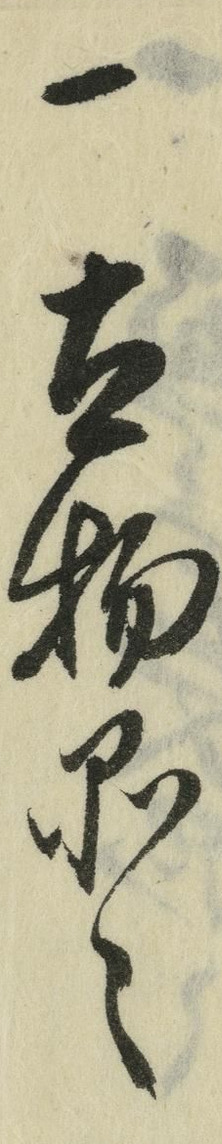一太物品々
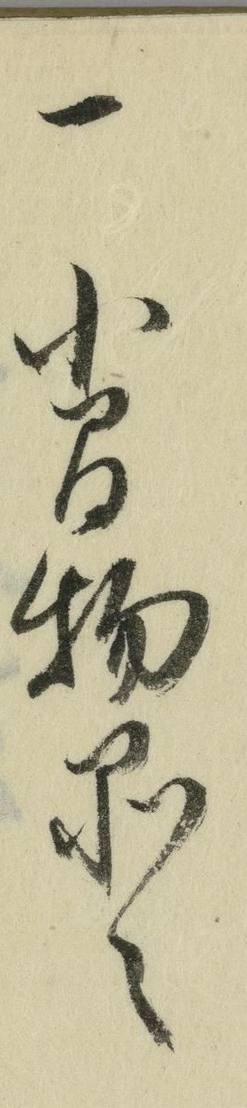一小間物品々
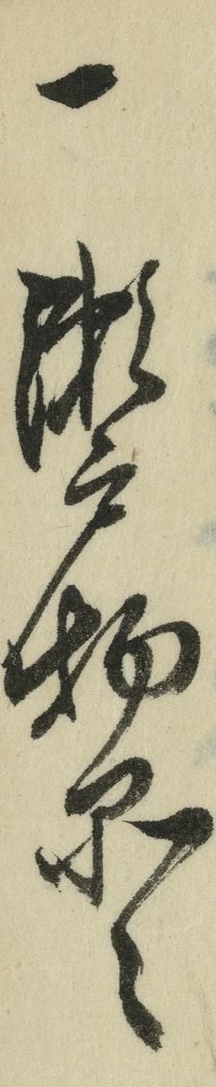一瀬戸物品々

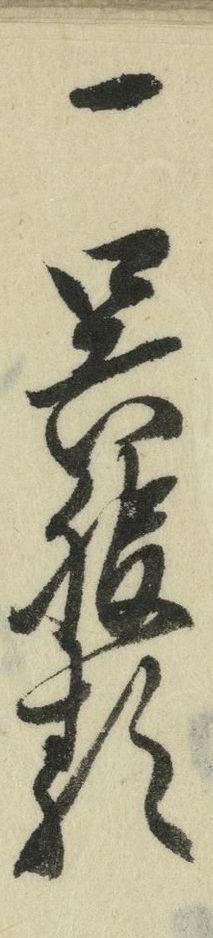一呉服類
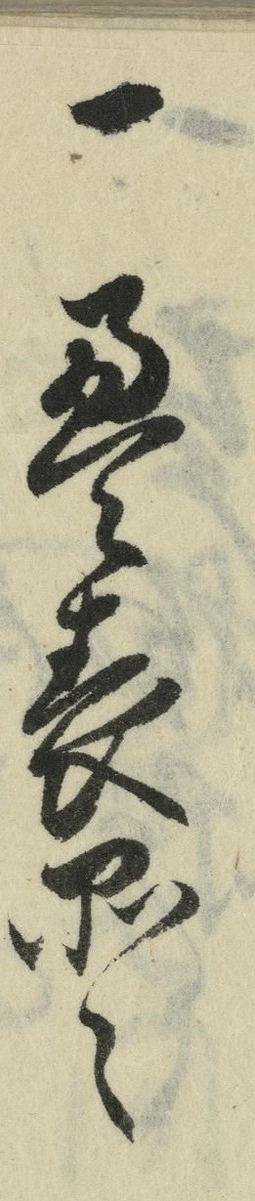一畳表品々
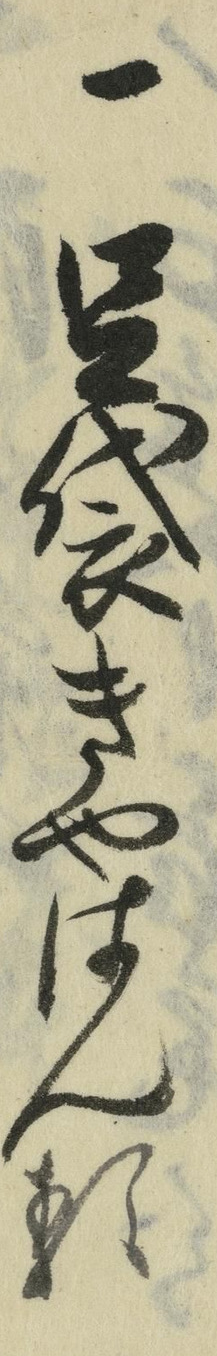一足袋きやはん類

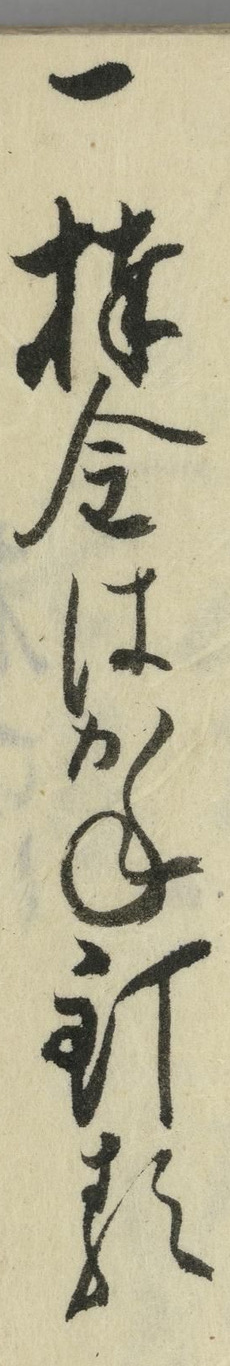一棒金はかね釘類
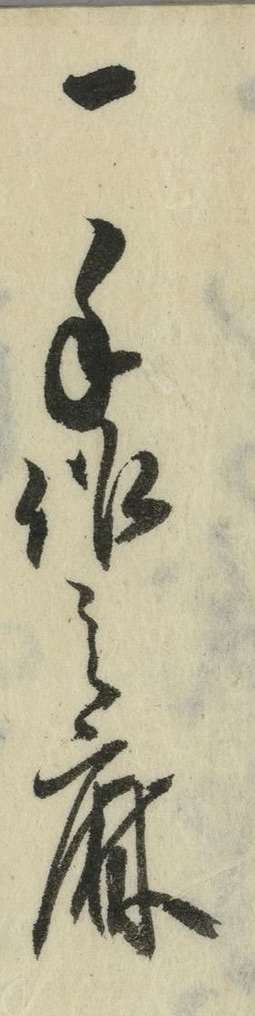一手作之麻
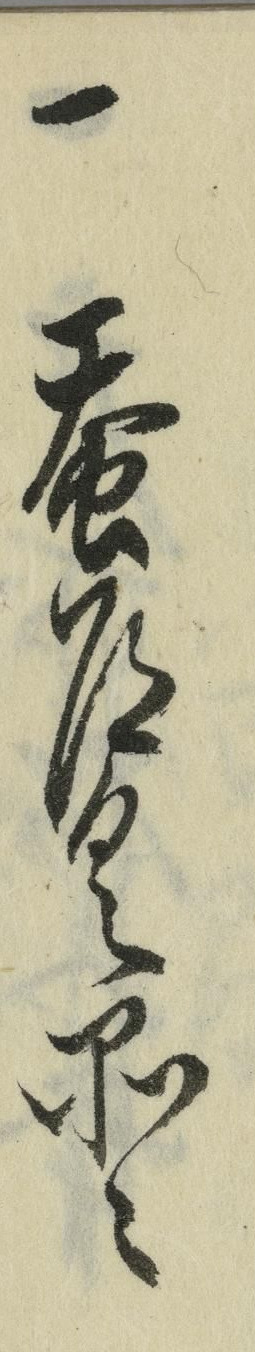一蚕道具品々

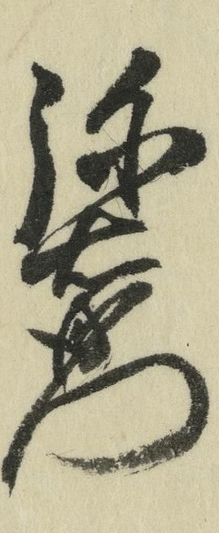弥右衛門
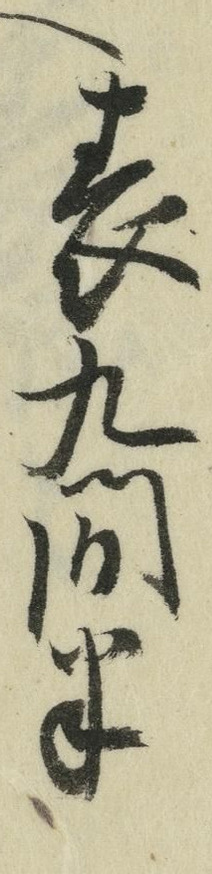表九間半
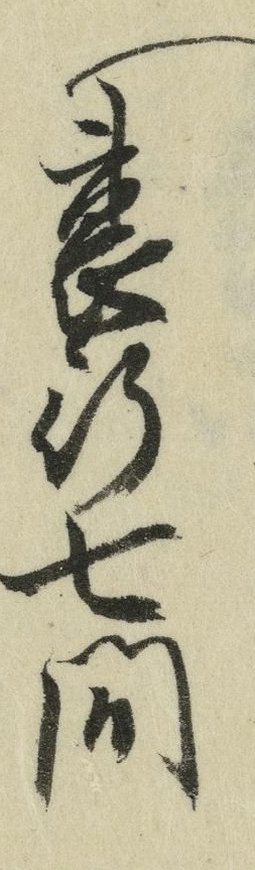裏行七間
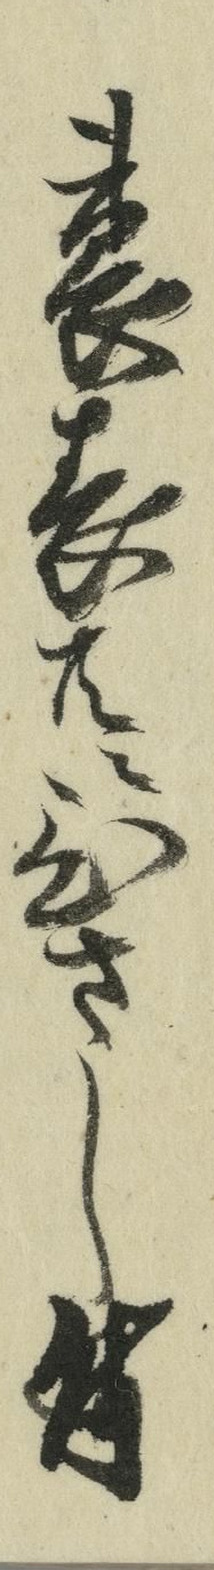裏表共二ひさし付
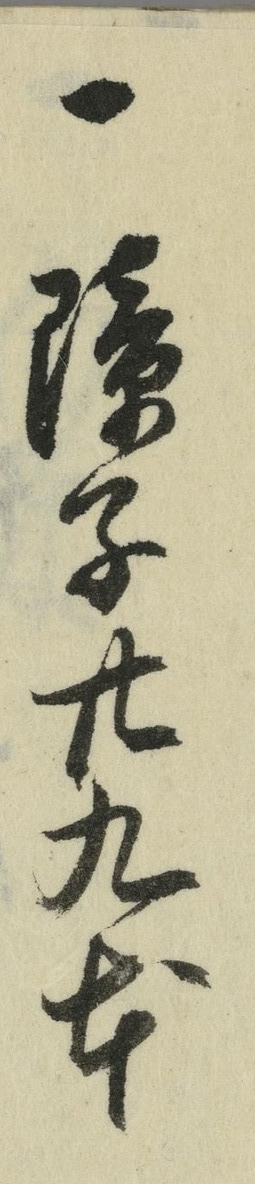一障子廿九本
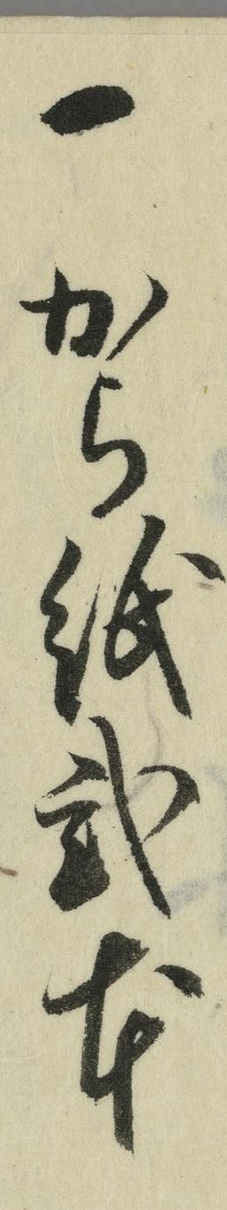一から紙弐本
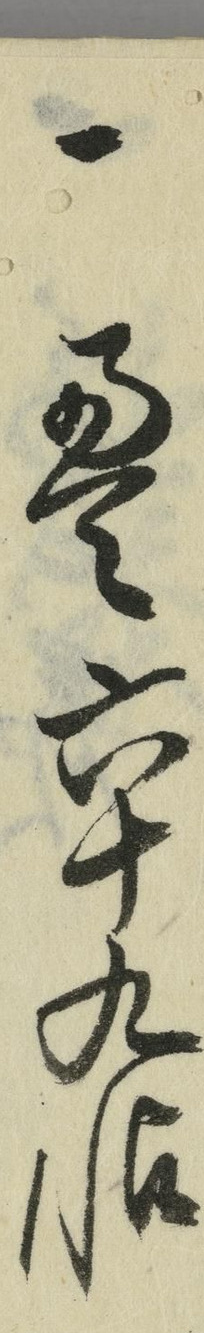一畳六十九帖
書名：天明淺間噴火ニ関スル書類
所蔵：東京大学地震研究所図書室 Earthquake Research Institute Library, The University of Tokyo, JAPAN
